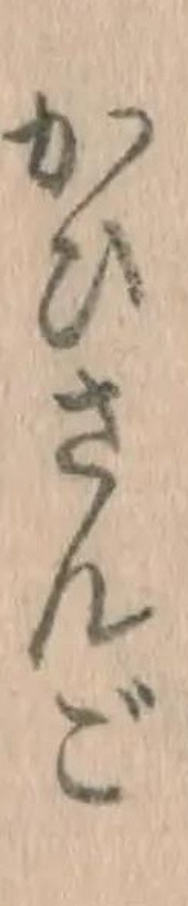かひさんご
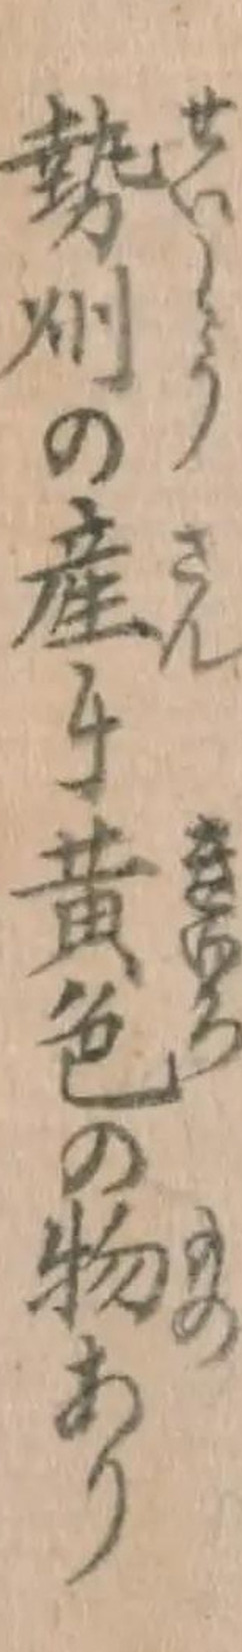勢州の産に黄色の物あり
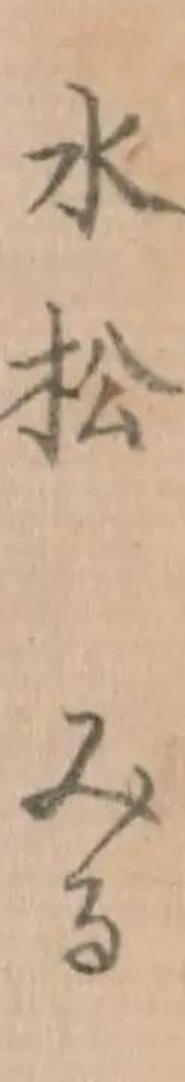水松みる
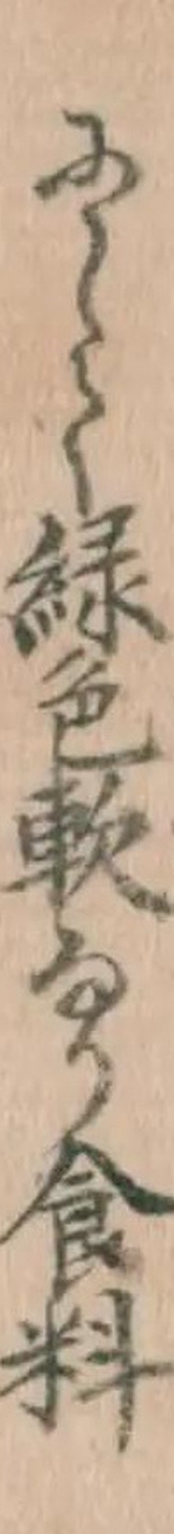にして緑色軟なり食料
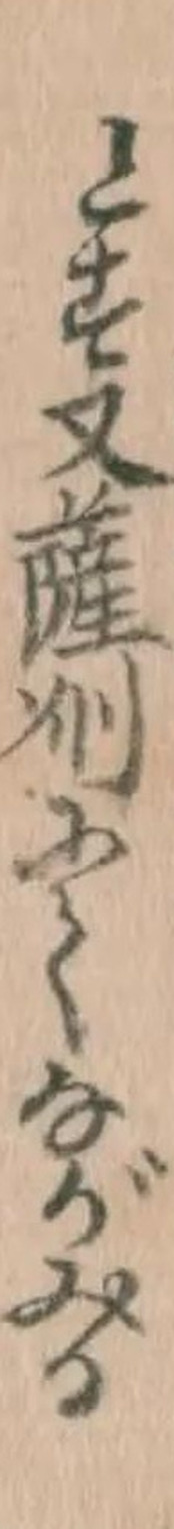とす又薩州にてながみる
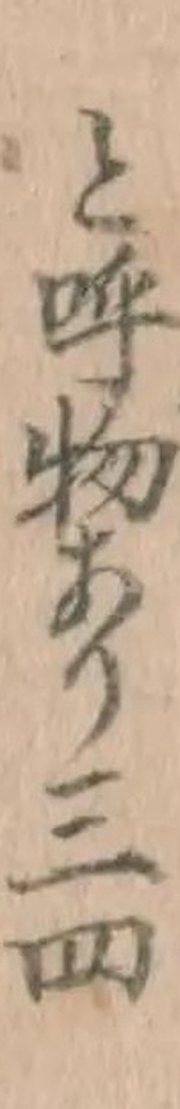と呼物あり三四
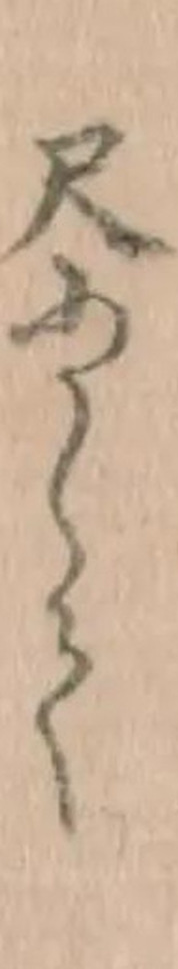尺にして
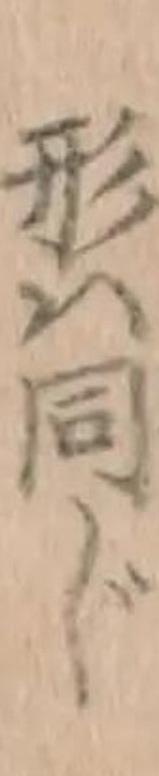形は同じ

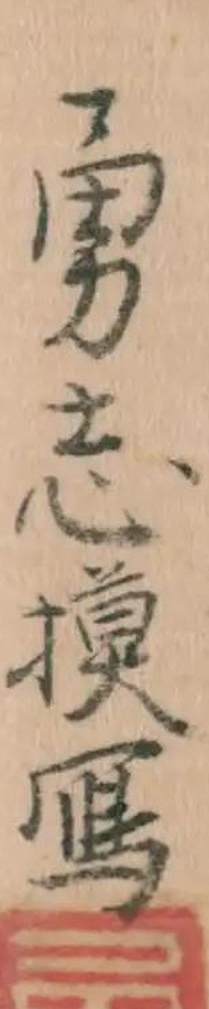勇志摸写

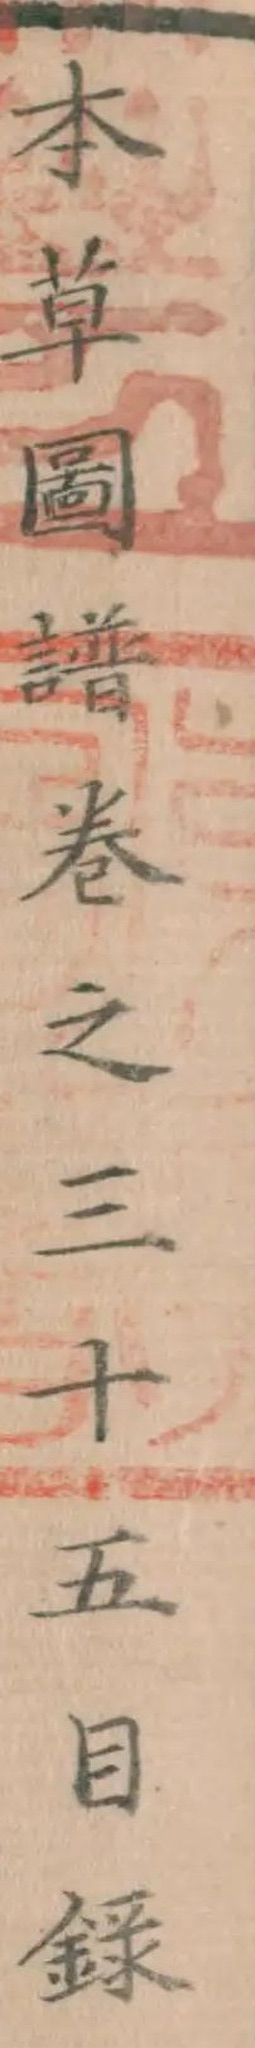本草図譜巻之三十五目録
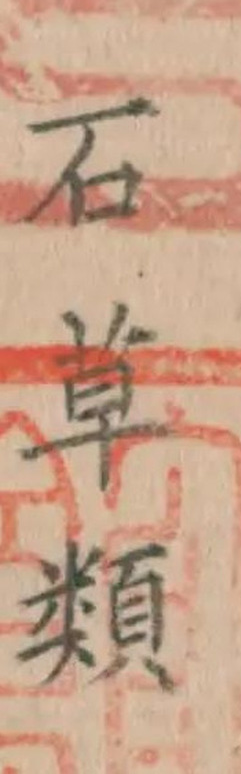石草類

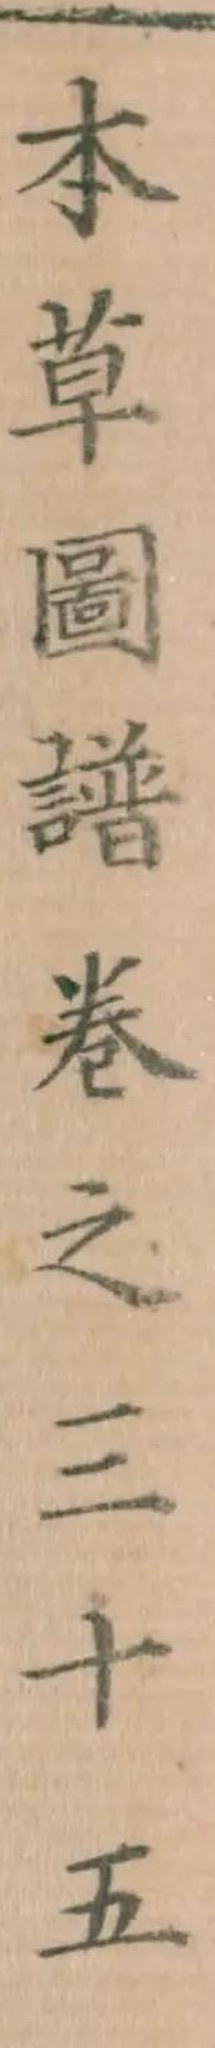本草図譜巻之三十五
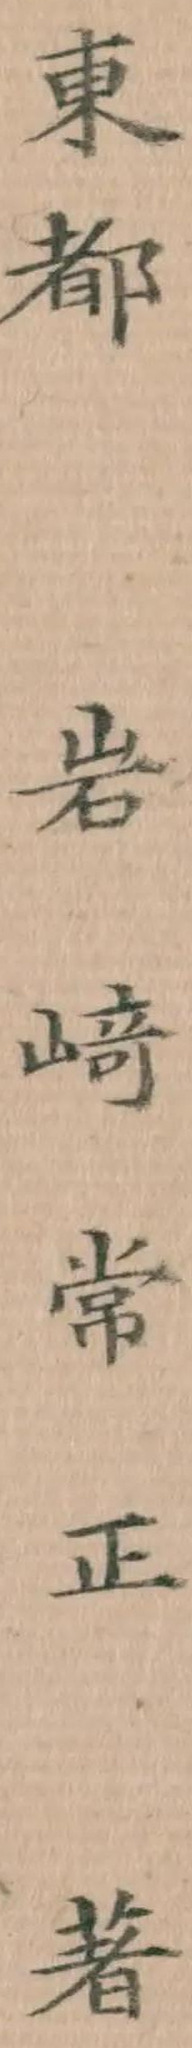東都岩崎常正著
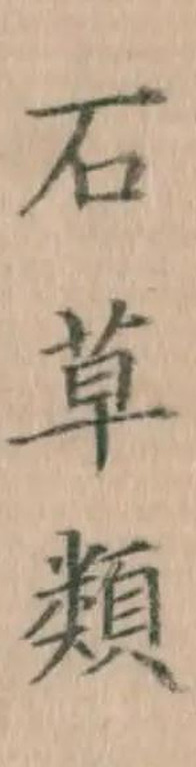石草類

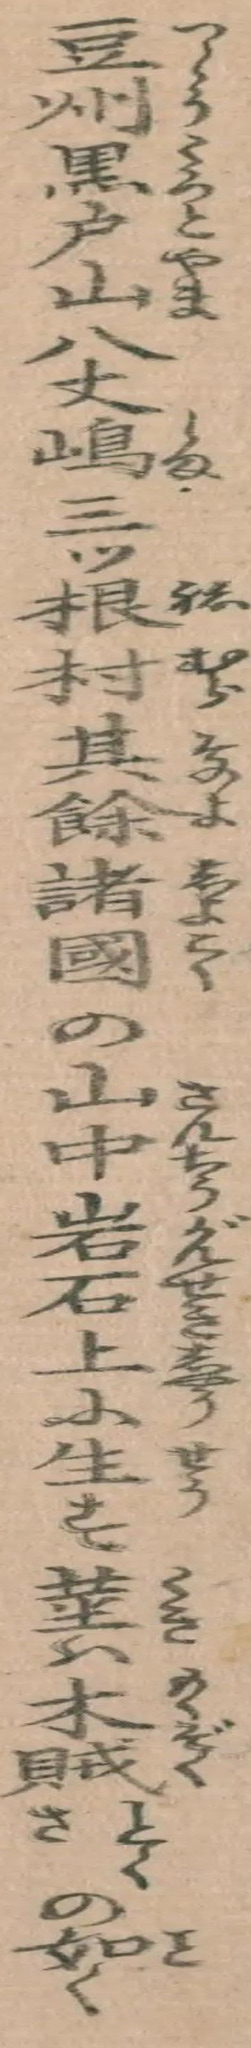豆州黒戸山八丈嶋三ツ根村其余諸国の山中岩石上に生す茎は木賊とくさの如く
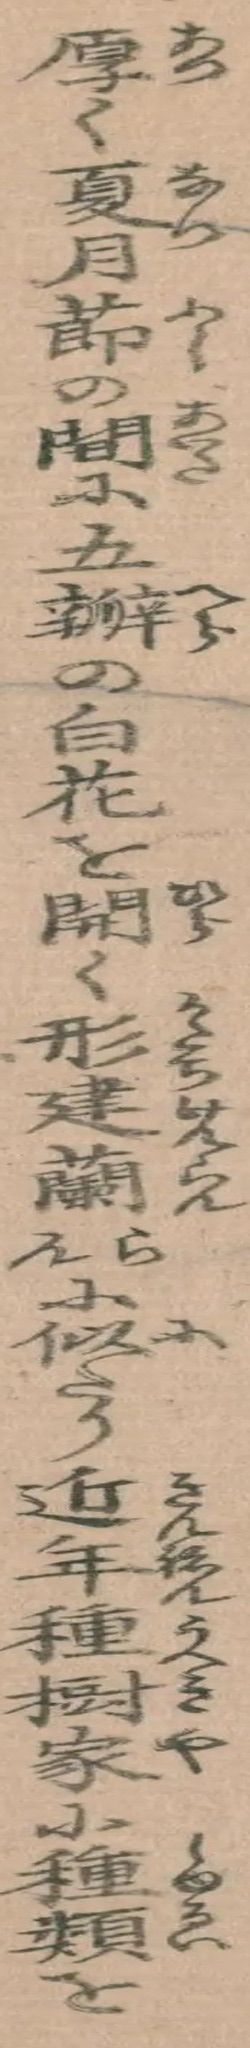厚く夏月節の間に五弁の白花を開く形建蘭らんに似たり近年種樹家に種類を
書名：本草図譜. 巻34-36
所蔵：国立国会図書館 National Diet Library, JAPAN
